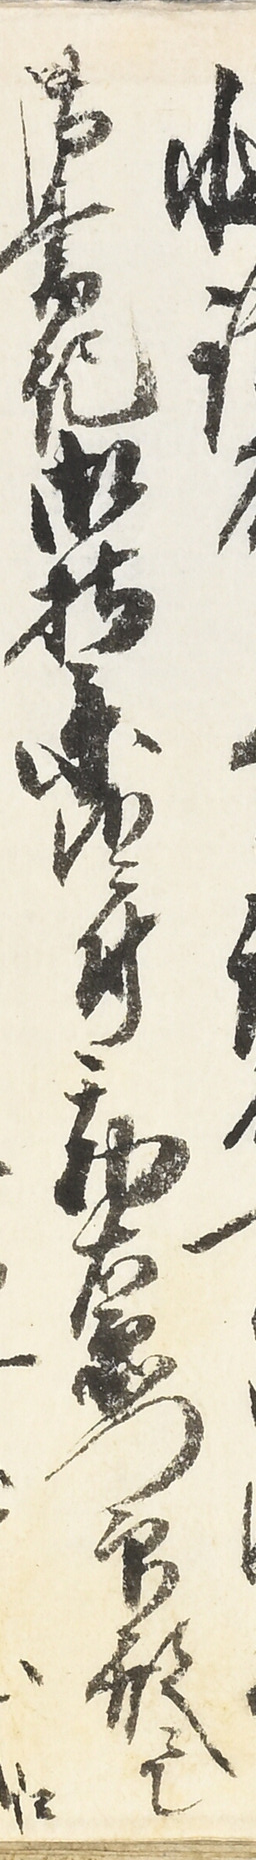御書記御持参候ニ付勘右衛門印形ニ而
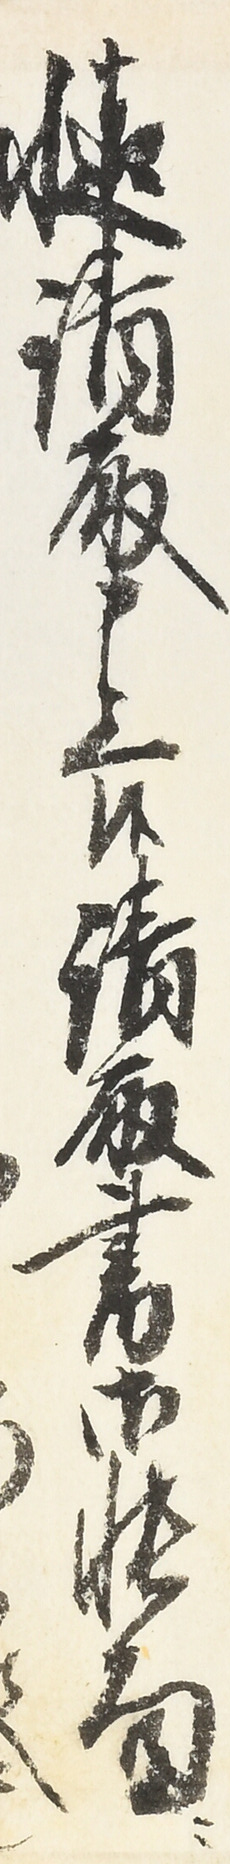慥請取申上候請取書御帳面ニ
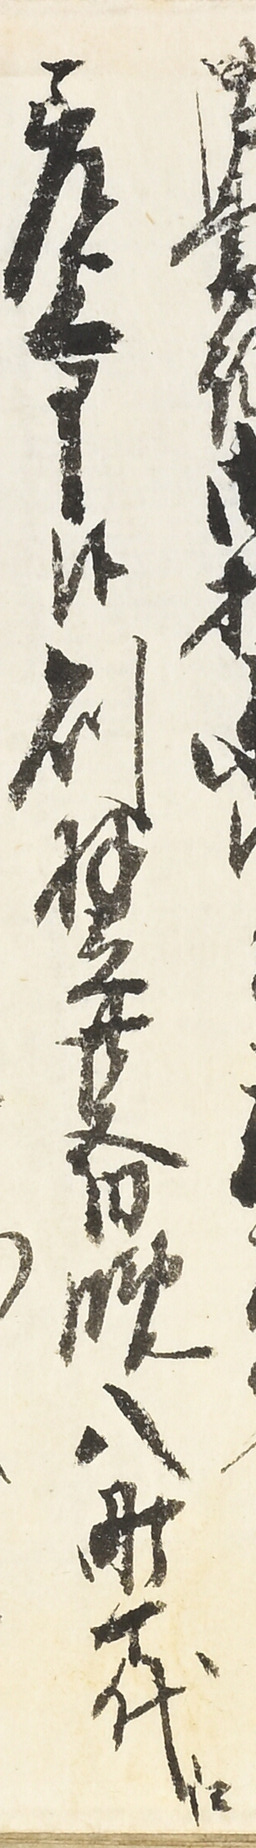差上申候則翌廿五日晩八町丁代江
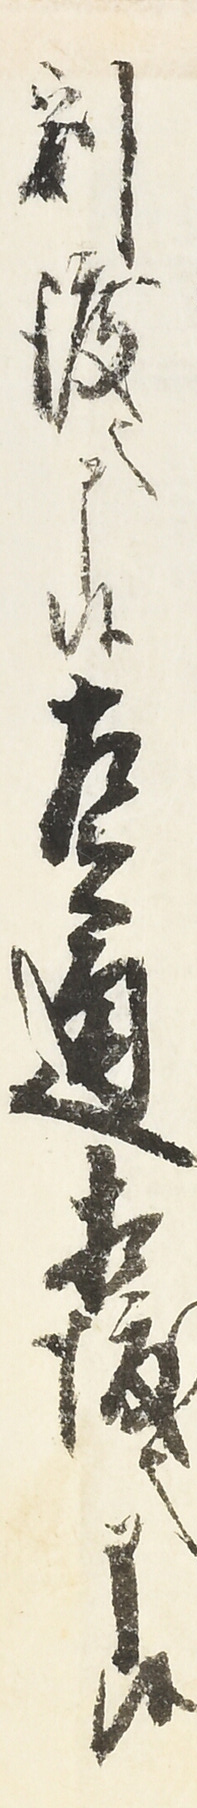割渡し申候左之通相渡し申候
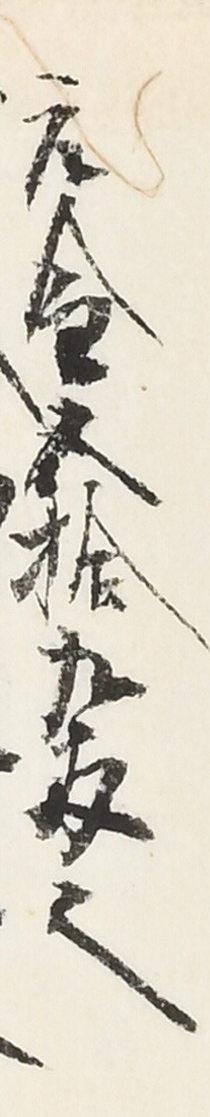元金五拾九両也
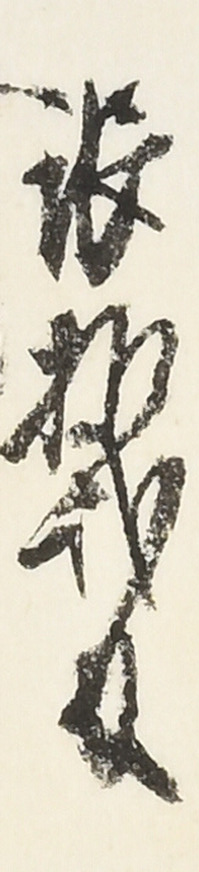銀拾弐匁
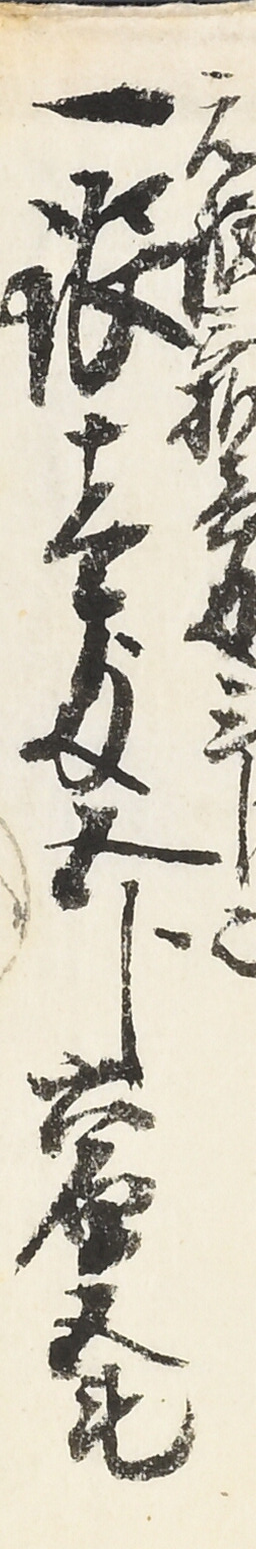一銀壱匁五分六厘五毛
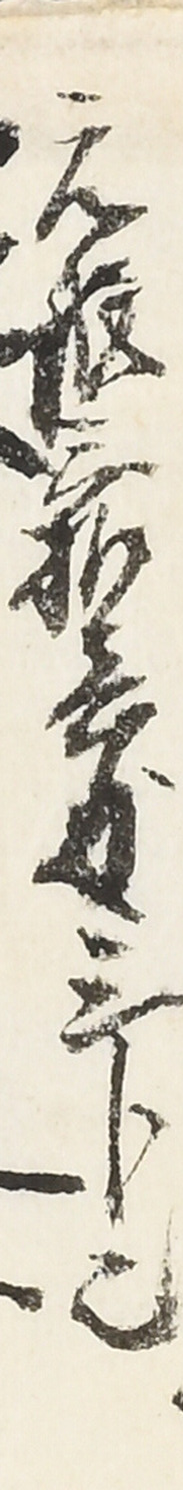元銀三拾壱匁三分也
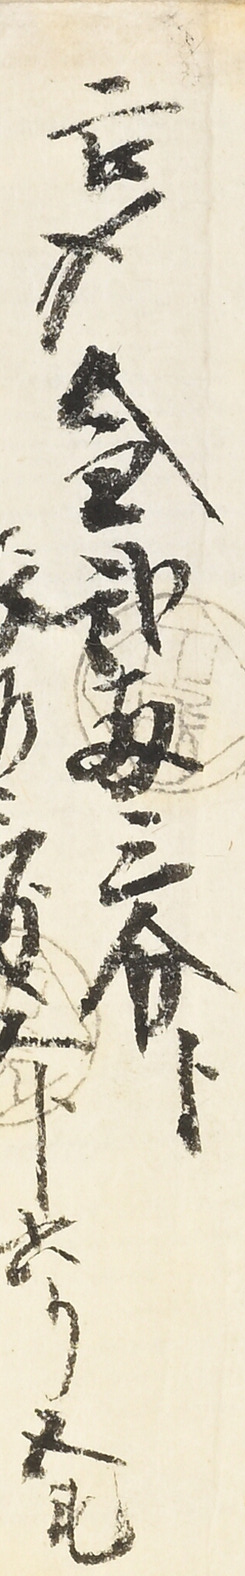二口〆金弐両三分ト
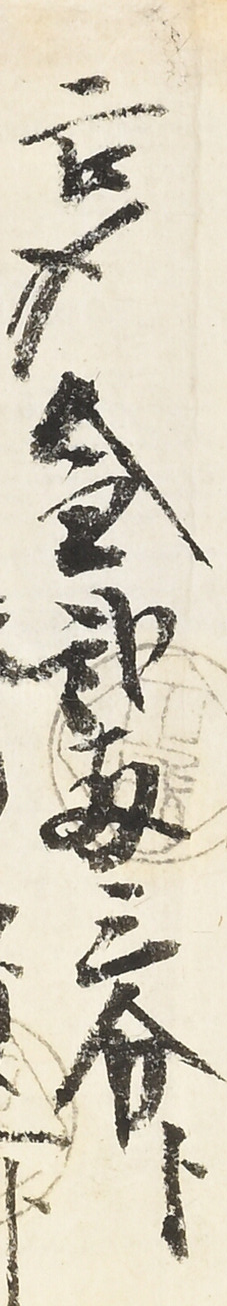二口〆金弐両三分ト
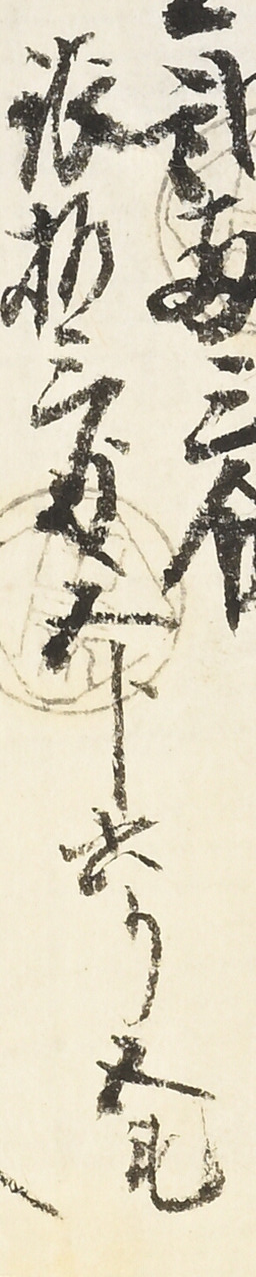銀拾三匁五分六厘五毛
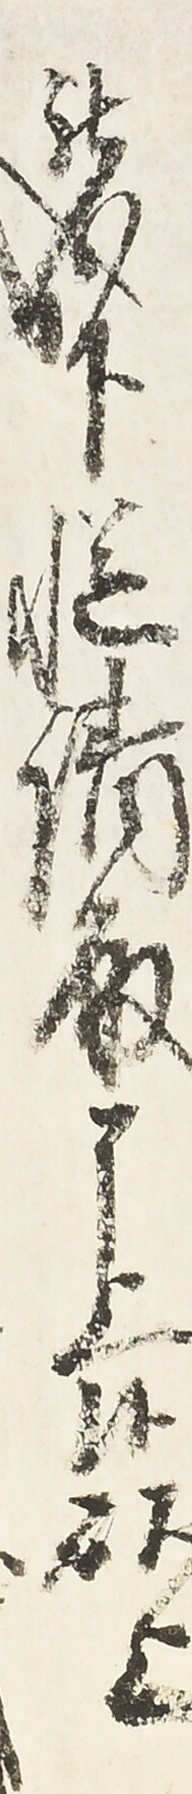被成下慥請取申上候以上
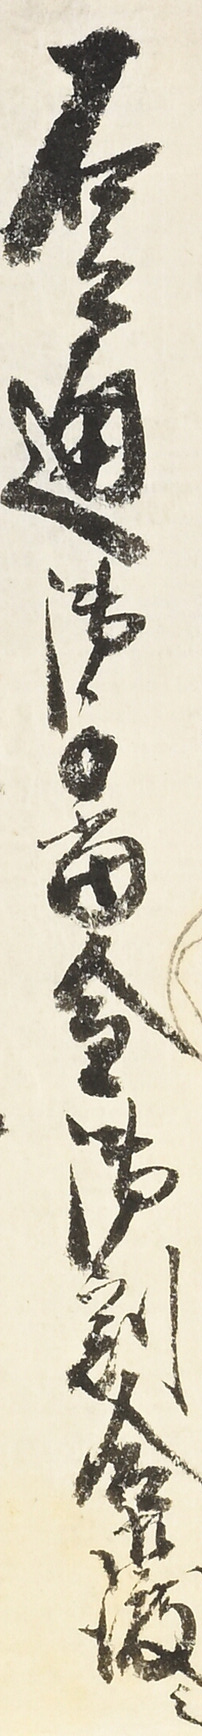右之通御手当金御割合御渡し
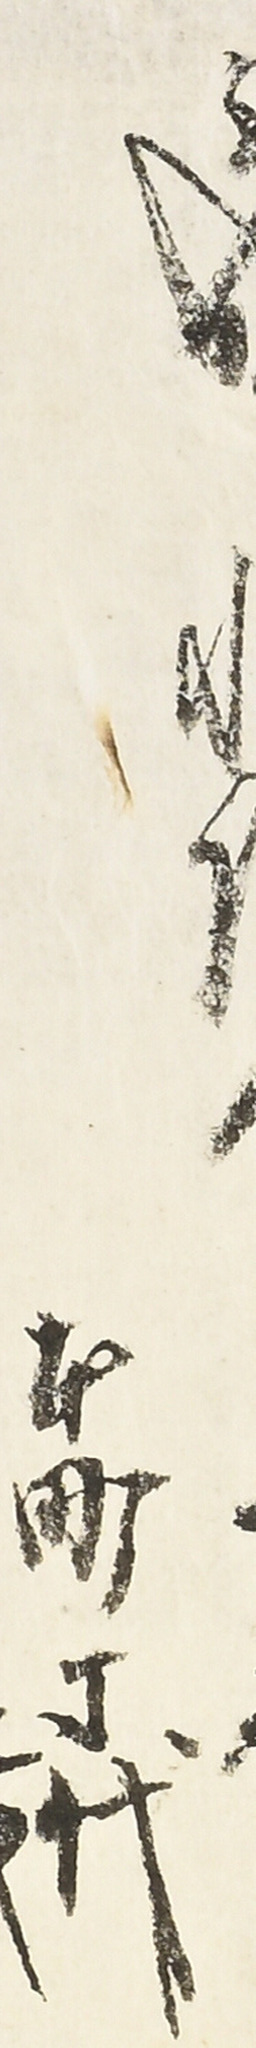本町丁代
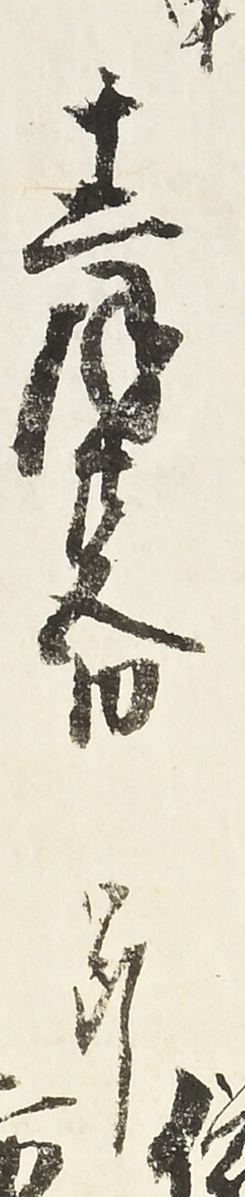十二月廿五日同断
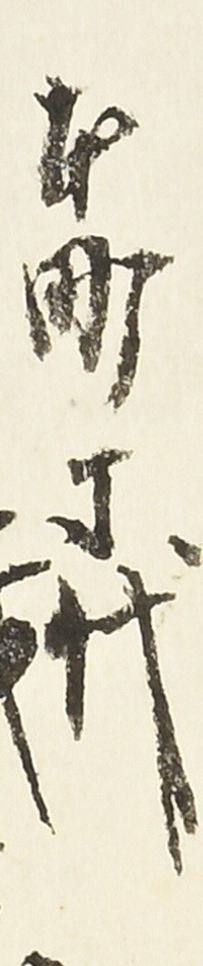本町丁代
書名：御才覚金御利足割渡扣帳
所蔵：伊那市立高遠町図書館・合同会社AMANE
